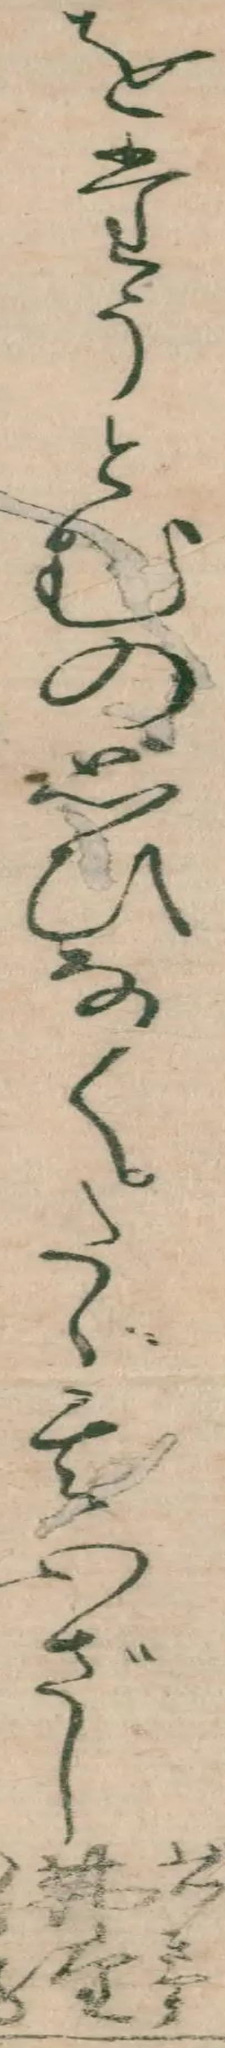をたうとむの思ひなく。たゞ其心ざし仏経
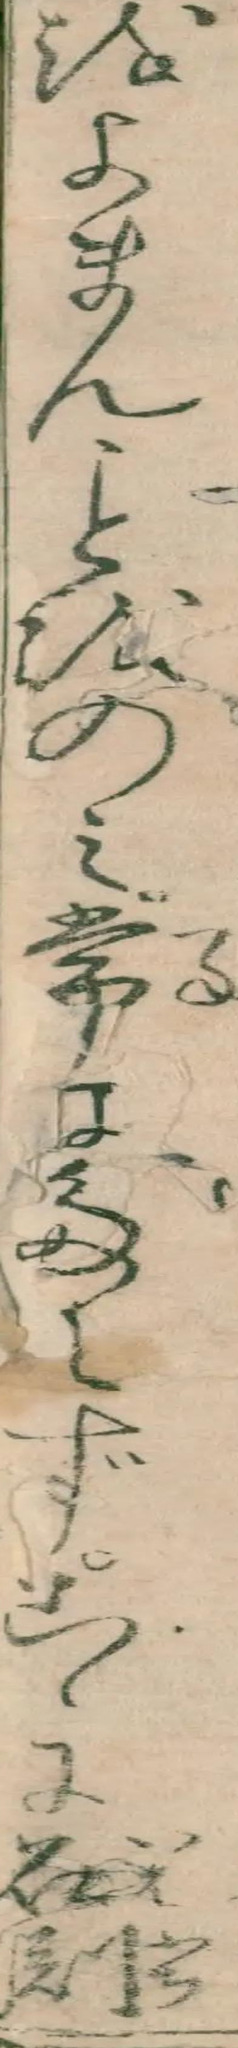をよまんことをのみ。常にたえず。こゝに石淵
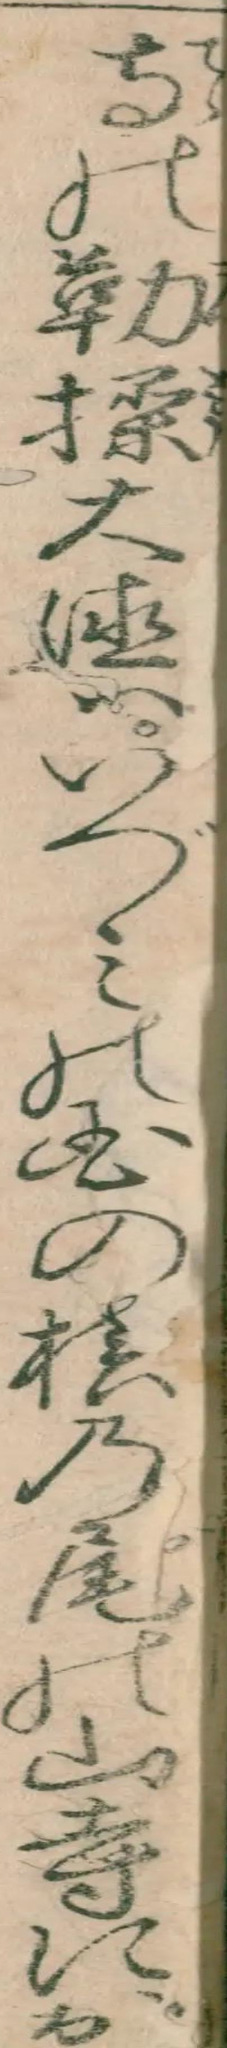寺の勤操大徳は。いづみの国の槙の尾の山寺にお
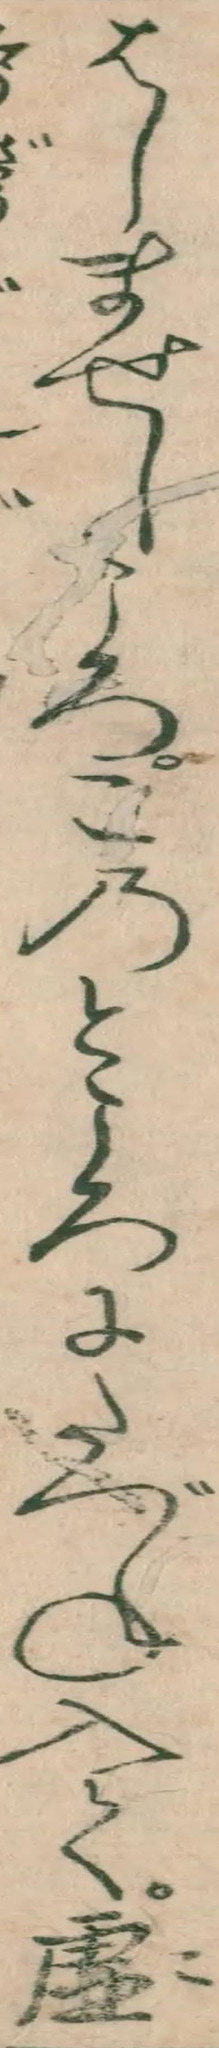はしませしころ。このところにたづね入て。虚
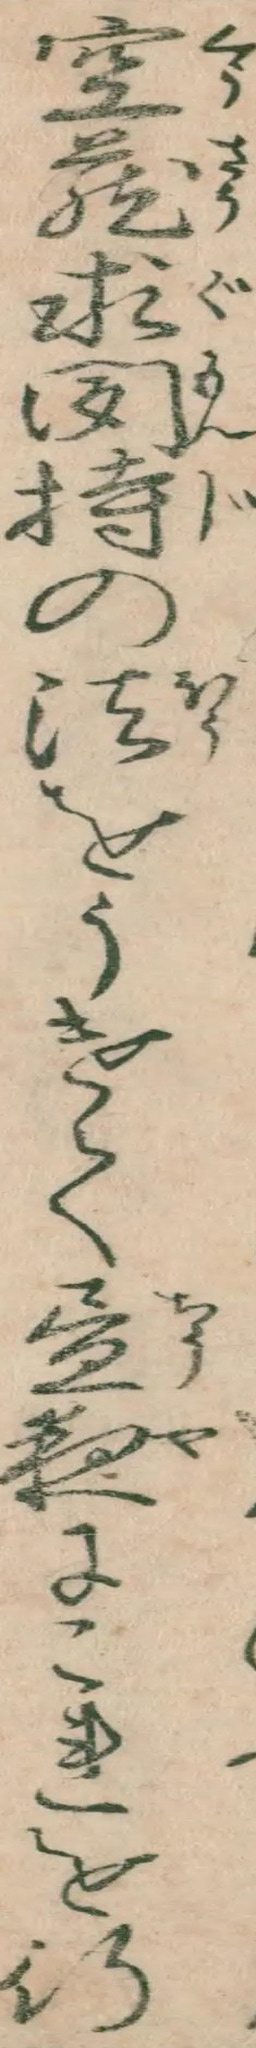空蔵求聞持の法をうけて昼夜にこれを行
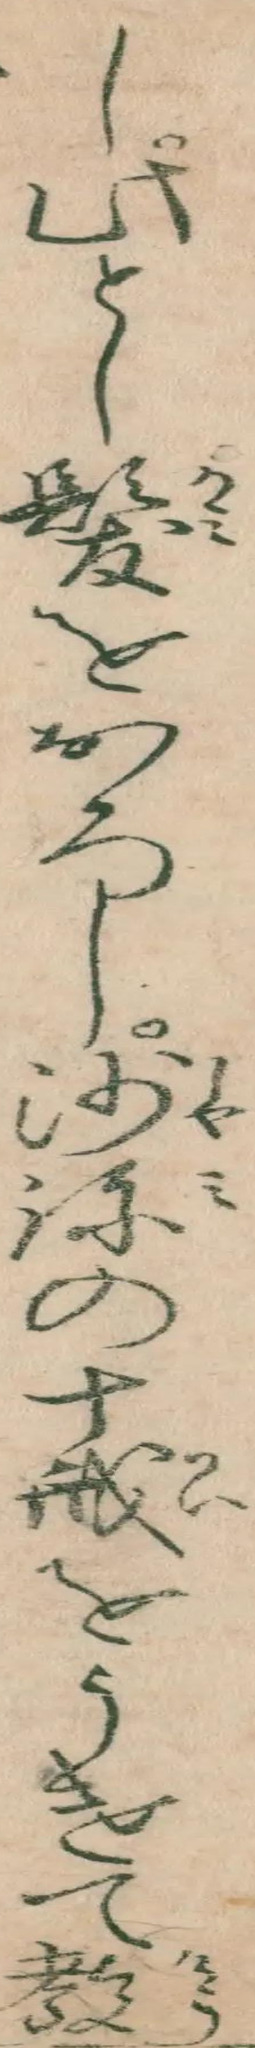し。此とし髪をおろし。沙弥の十戒をうけて教
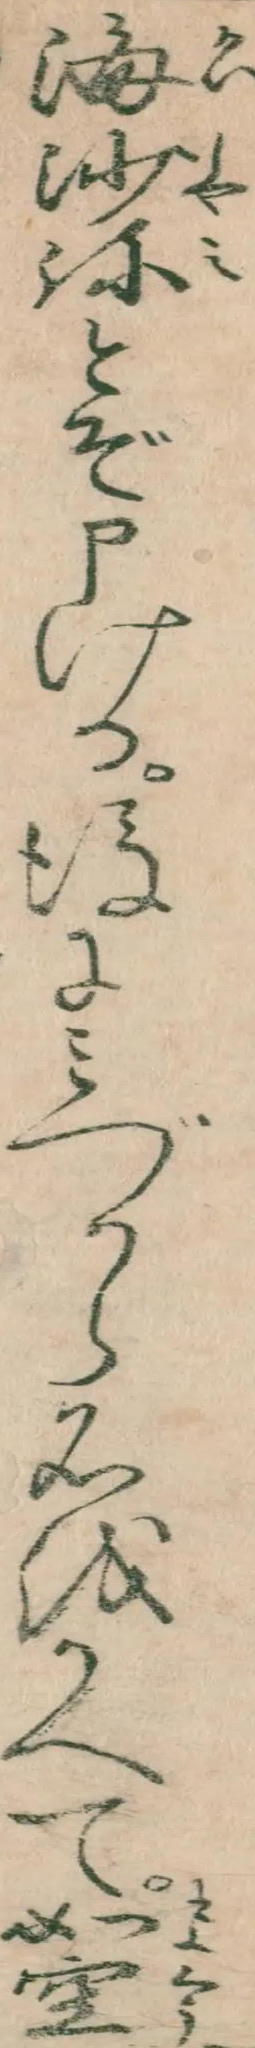海沙弥とぞ申ける。後にみづから名をかへて。如空
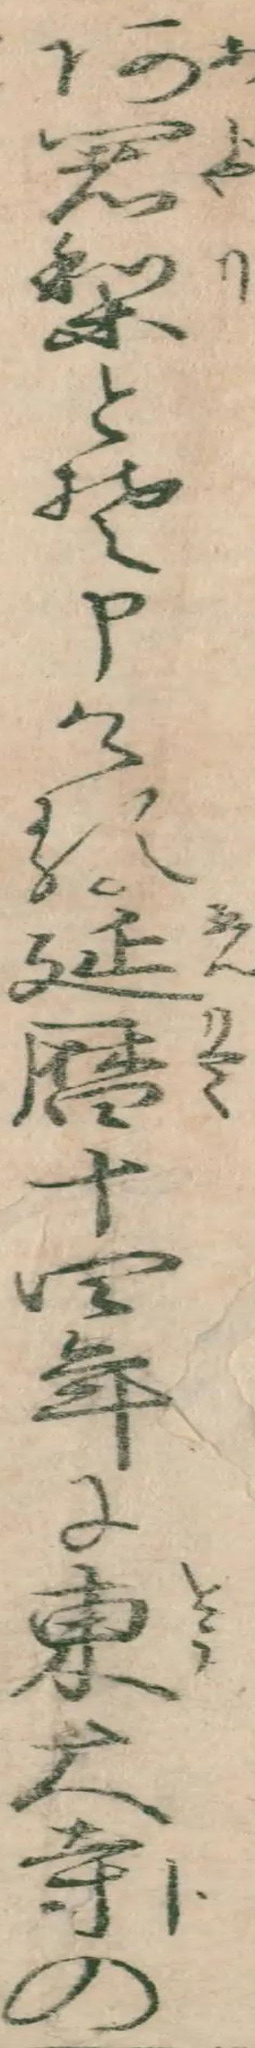阿闍梨とそ申ける。延暦十四年に東大寺の
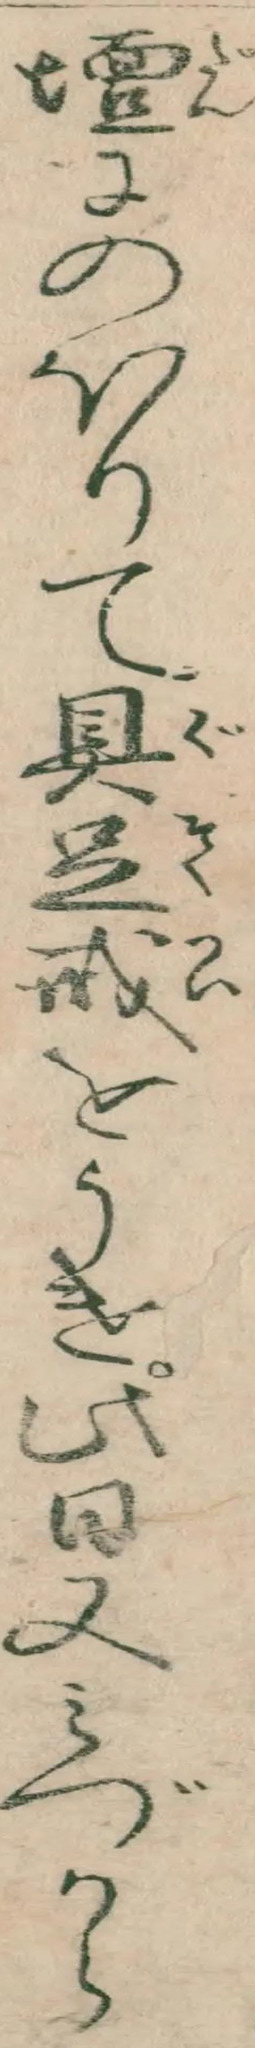壇にのほりて。具足戒をうけ。此日又みづから
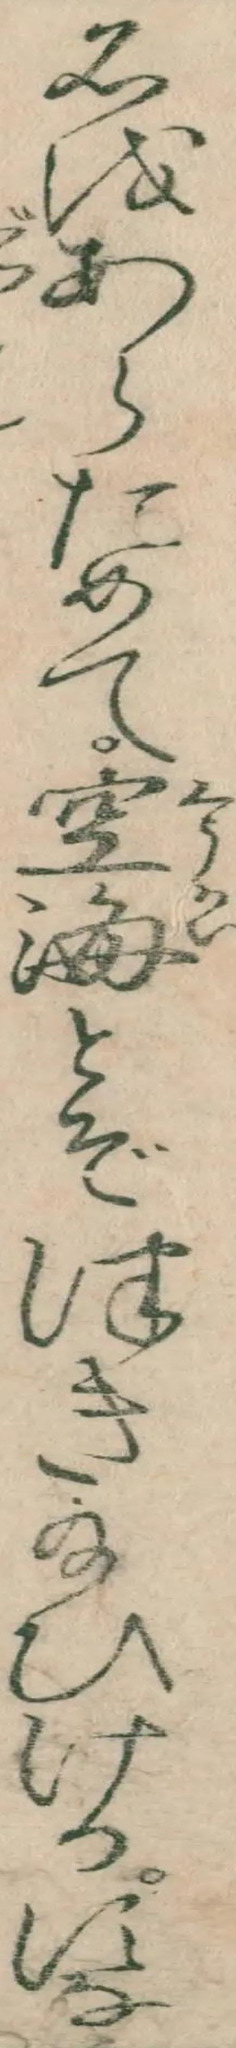名をあらためて。空海とぞつき給ひける。すな
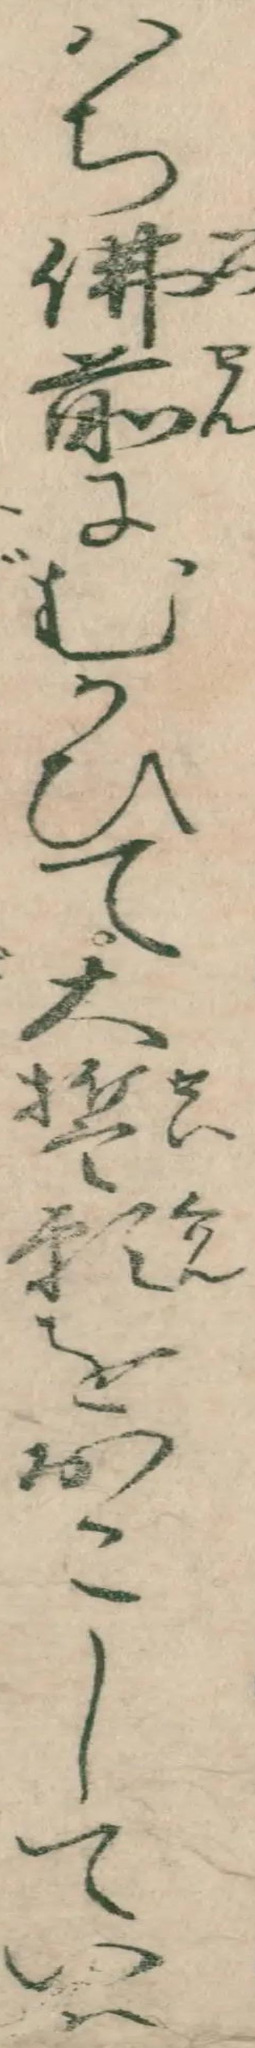はち仏前にむかひて大誓願をおこしていは
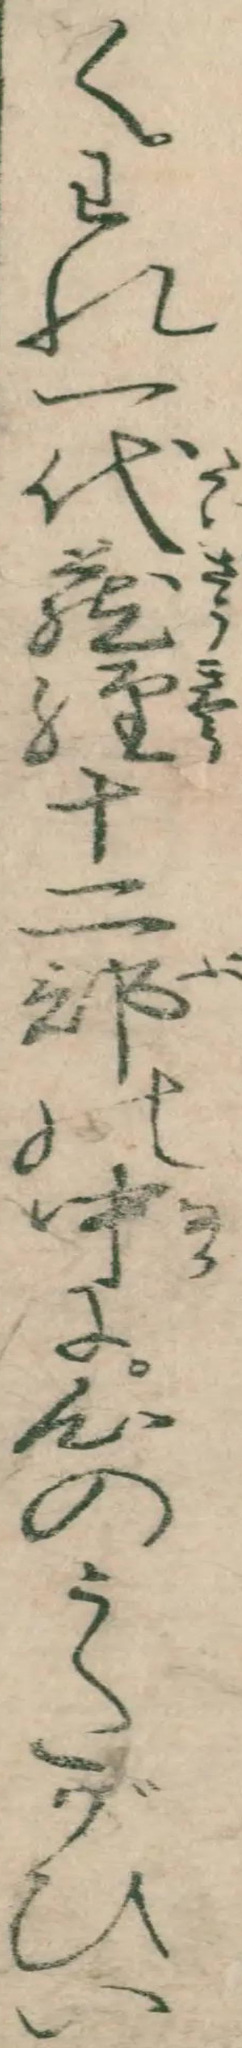く。われ一代蔵経十二部の中に。心のうたがひい

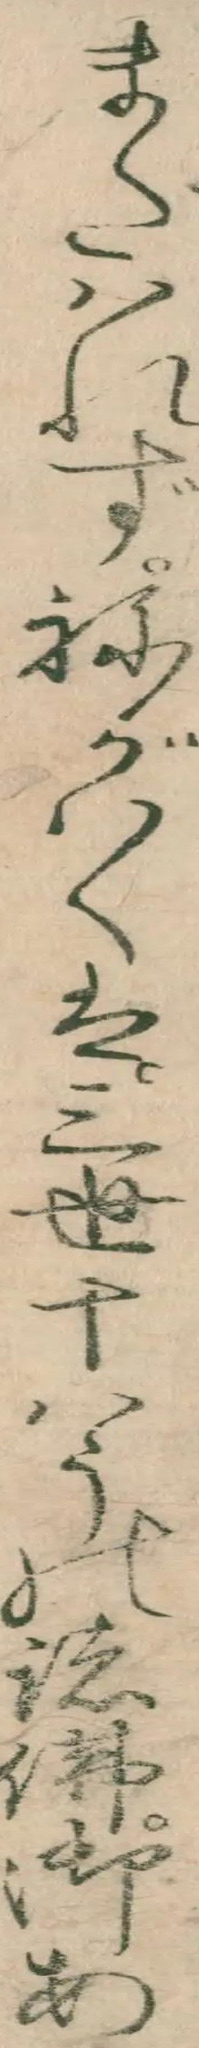まだはれず。ねがはくは。三世十はうの諸仏。御あ
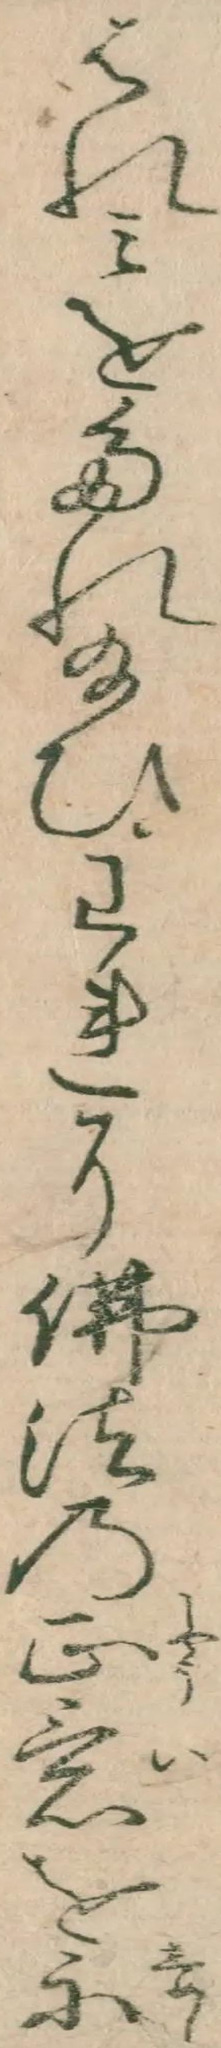はれみをたれ給ひ。われに諸法の正意を示
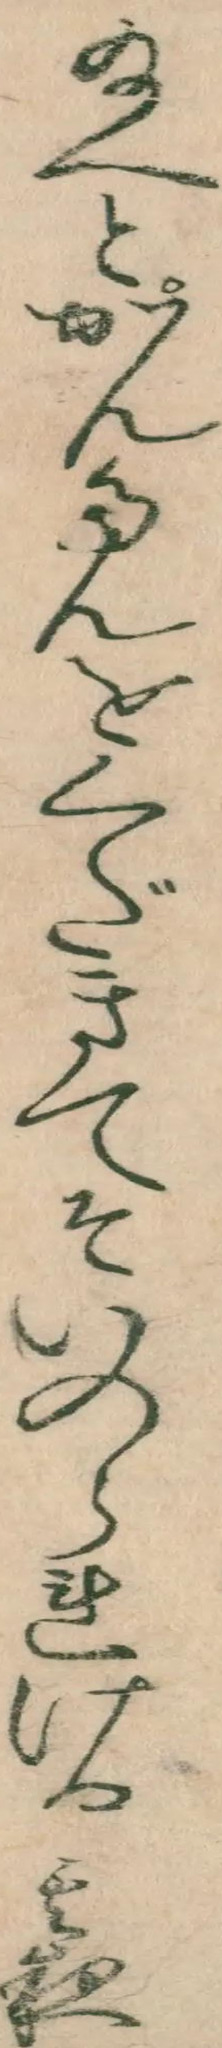給へと。かんたんをくだきてそいのられける其夜
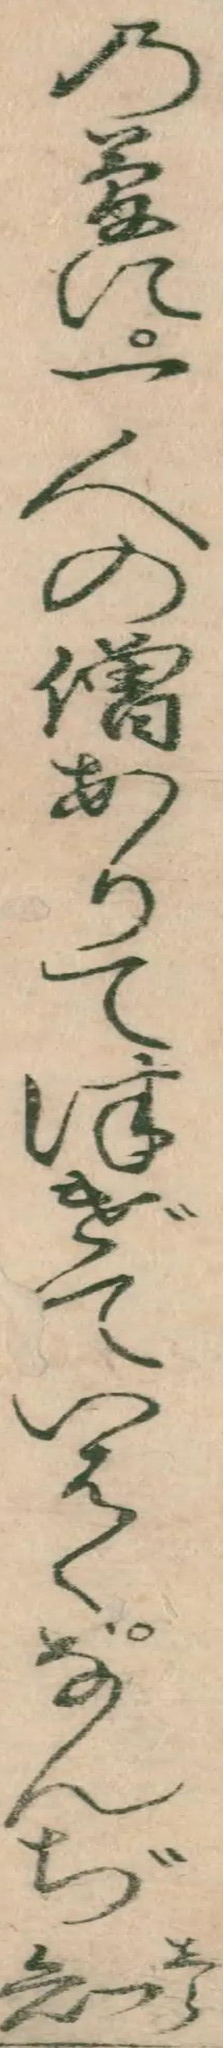の夢に。一人の僧ありてつげていはく。なんぢ知
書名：弘法大師御本地 3巻. [1]
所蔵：国立国会図書館 National Diet Library, JAPAN
